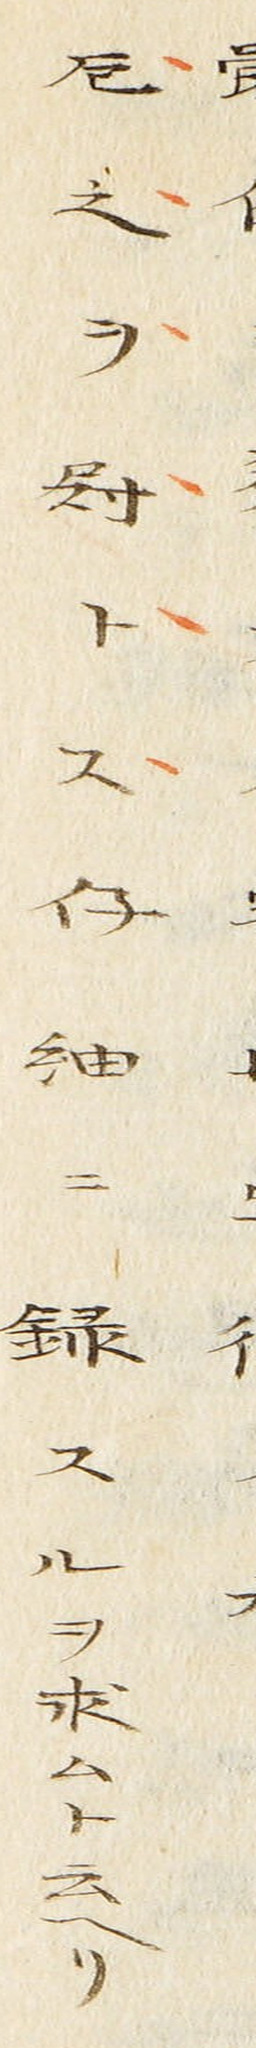厄之ヲ尉？トス仔細ニ録スルヲ求ムト云ヘリ
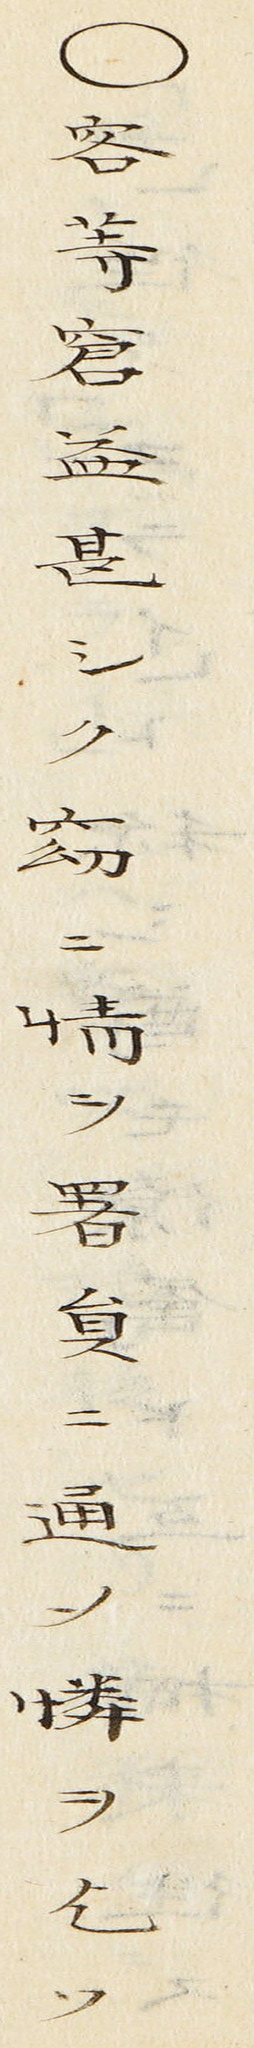〇客等窘益甚シク窈ニ情ヲ署員ニ通シテ憐ヲ乞？フ
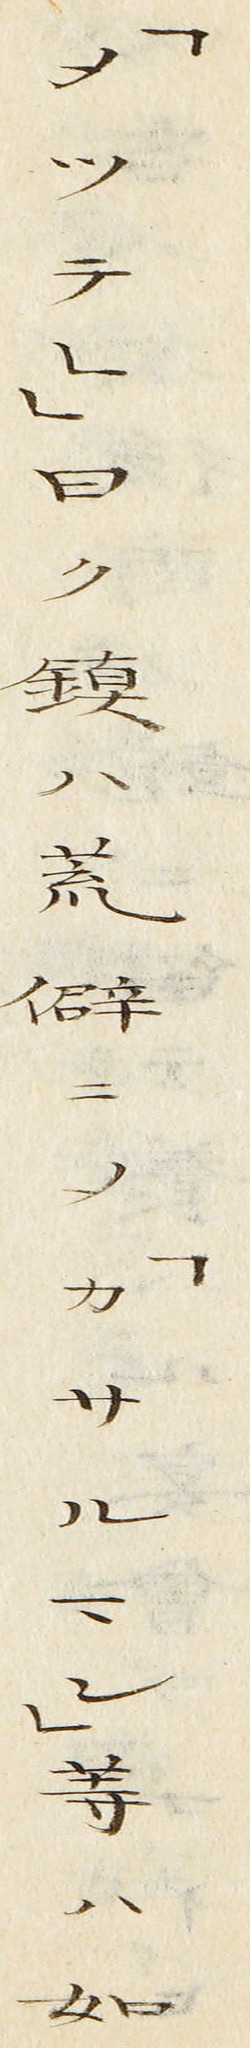「メツテレ」曰ク鎮ハ荒僻ニシテ「カサルマン」等ハ如
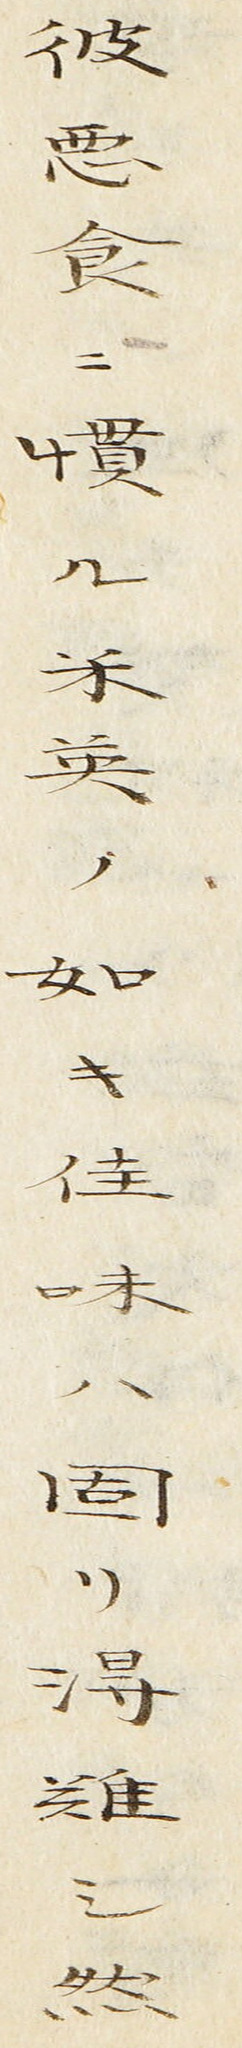彼悪食ニ慣ル米英ノ如キ佳味ハ固リ得難シ然
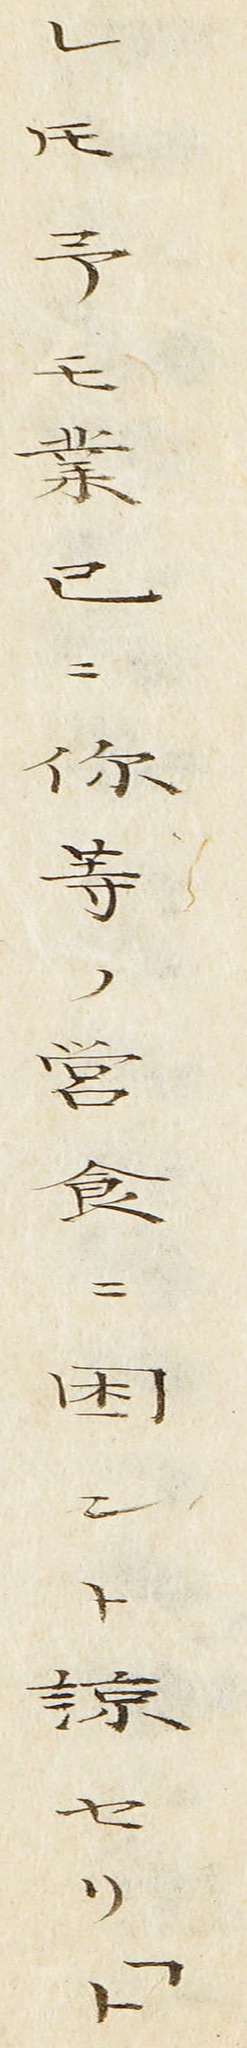レトモ予モ業已ニ你等ノ営食ニ困ント諒セリ「ト
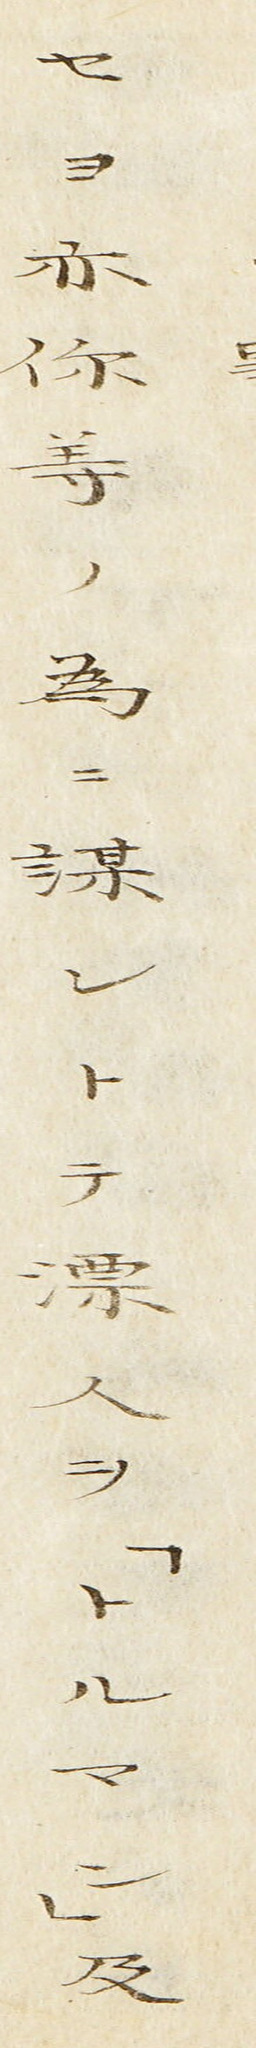セヨ亦你等ノ為ニ謀ントテ漂人ヲ「トルマン」及
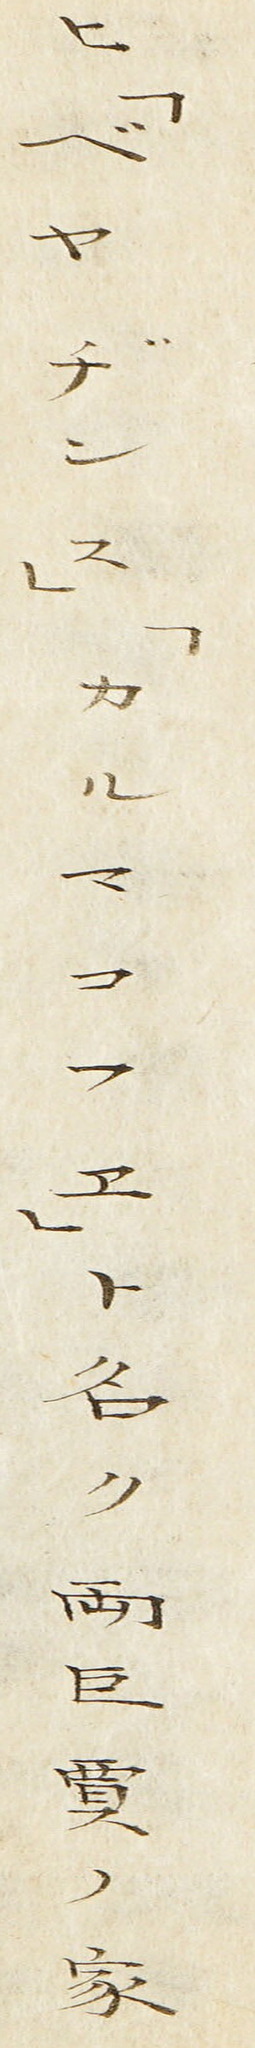ヒ「ベヤヂンス」「カルマコフヱ」ト名ク両巨賈ノ家
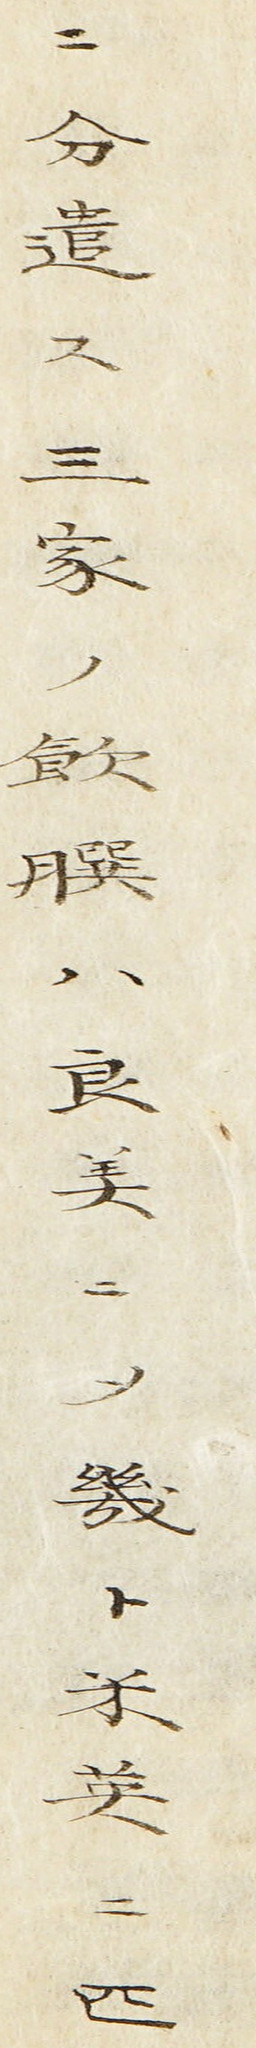ニ分遣ス三家ノ飲ハ良美ニシテ幾ト米英ニ匹
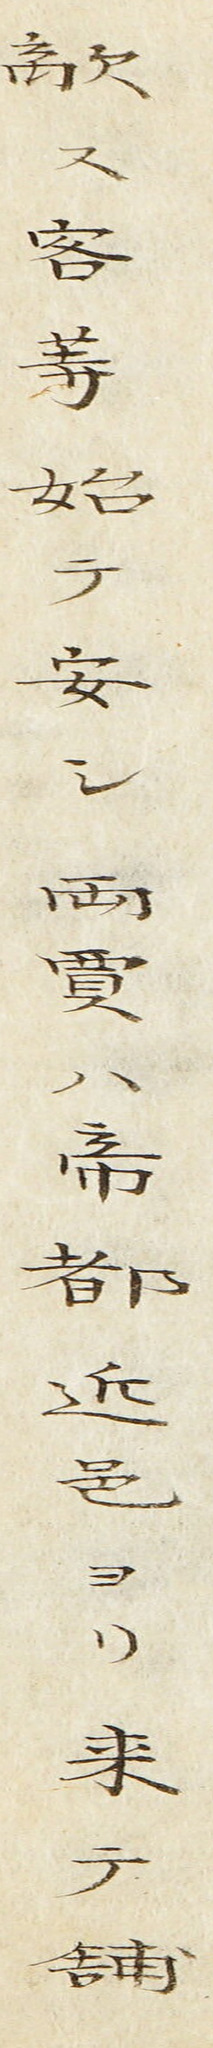敵ス客等始テ安シ両賈ハ帝都近邑ヨリ来テ舗

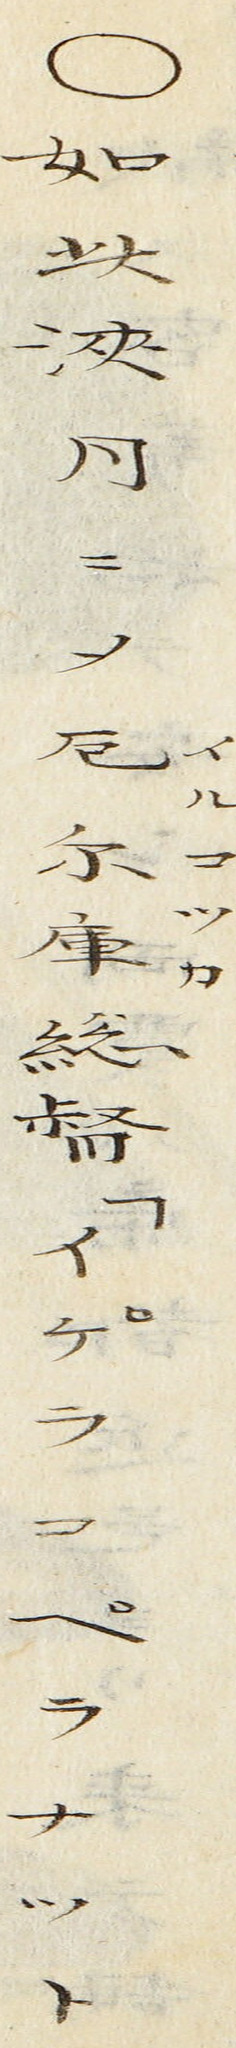如此浹月ニシテ厄尓庫総督「イケラコペラナツト
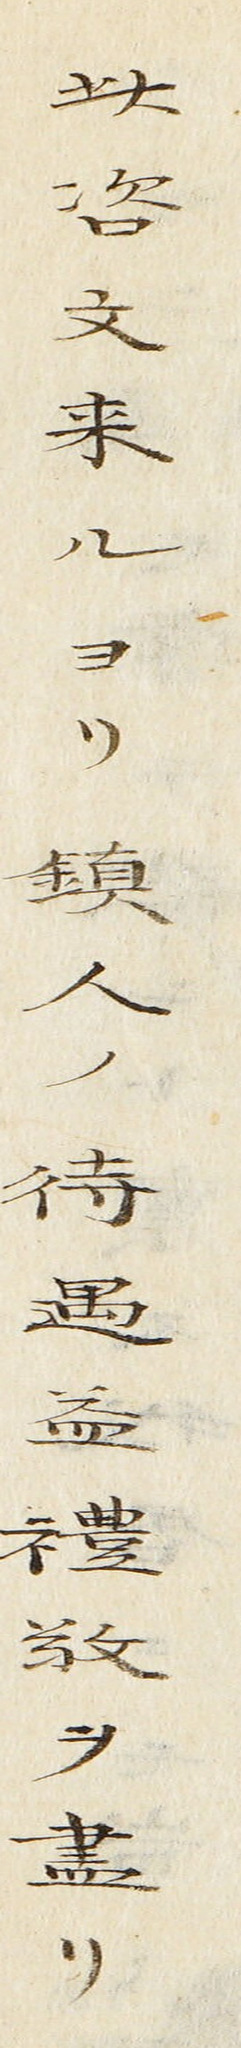此咨文来ルヨリ鎮人ノ待遇益礼敬ヲ尽リ
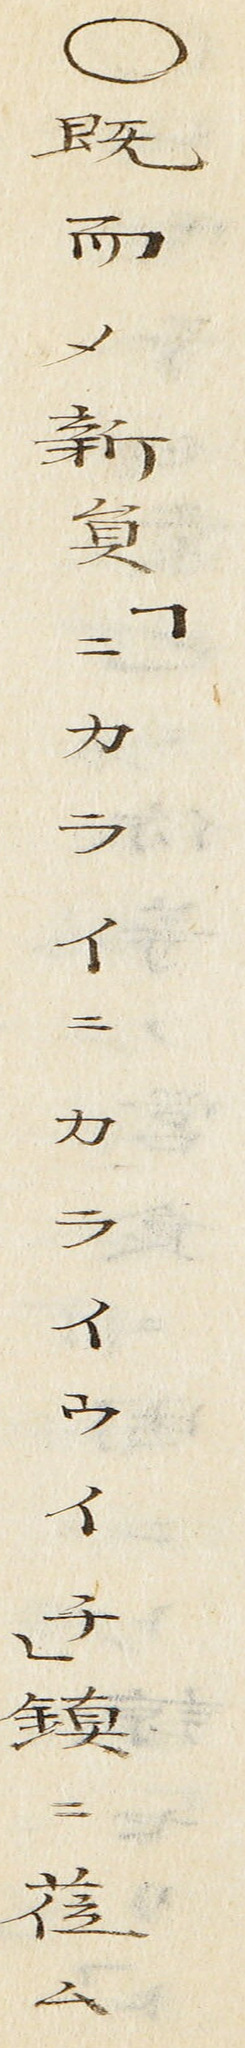〇既而シテ新員「ニカライカライウイチ」鎮ニ莅ム
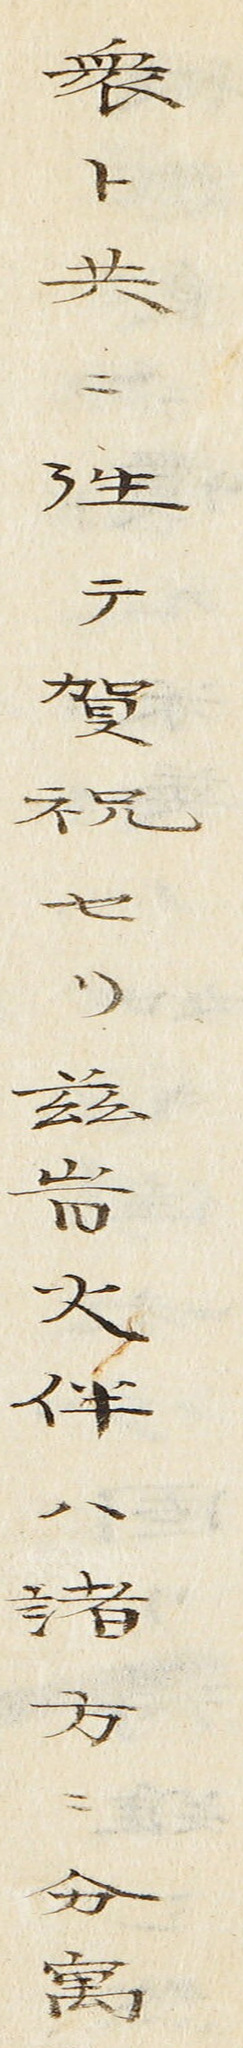衆ト共ニ往テ賀祝セリ茲時火伴ハ諸方ニ分寓
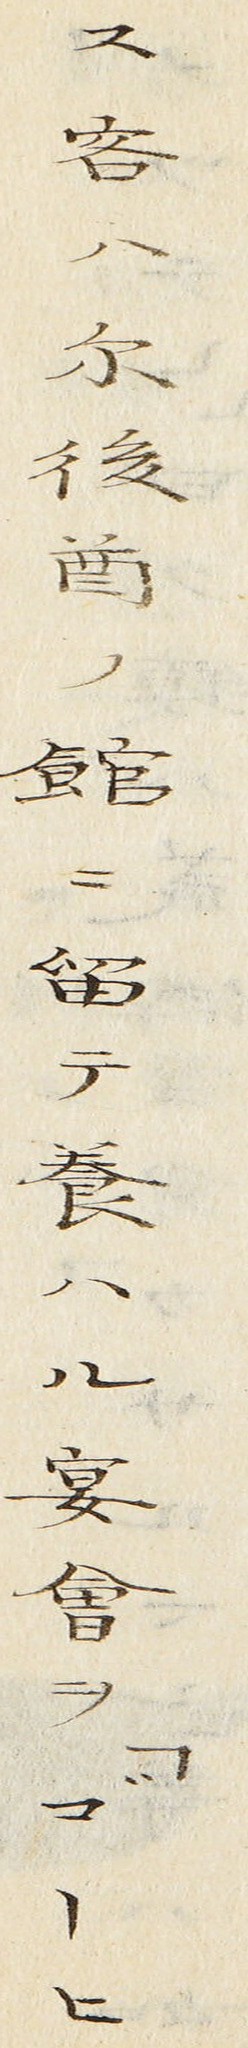ス客ホ尓後酋ノ館ニ留テ養ハル宴会ヲ「ゴーヒ
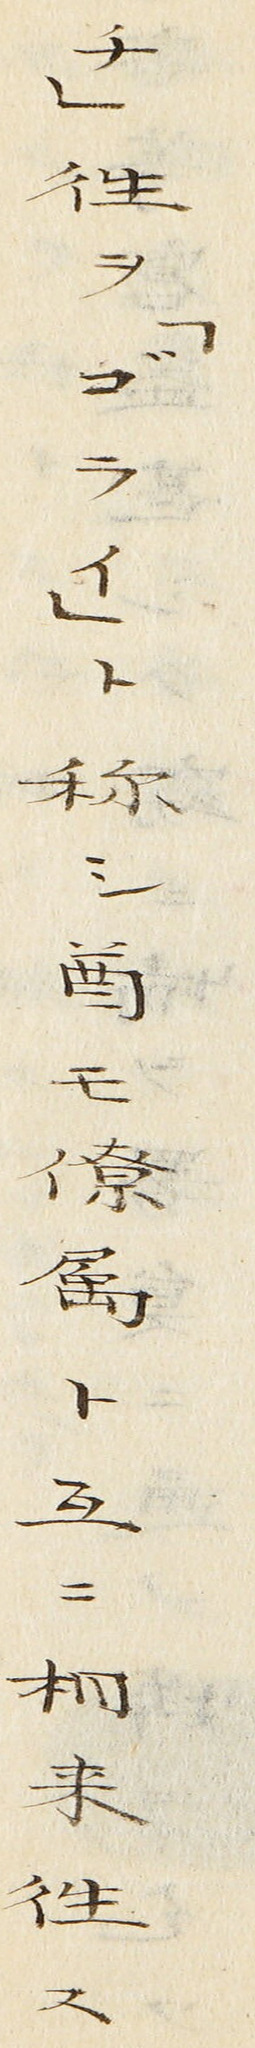チ」往ヲ「ゴライ」ト称シ酋モ糧僚属ト互ニ相来往ス
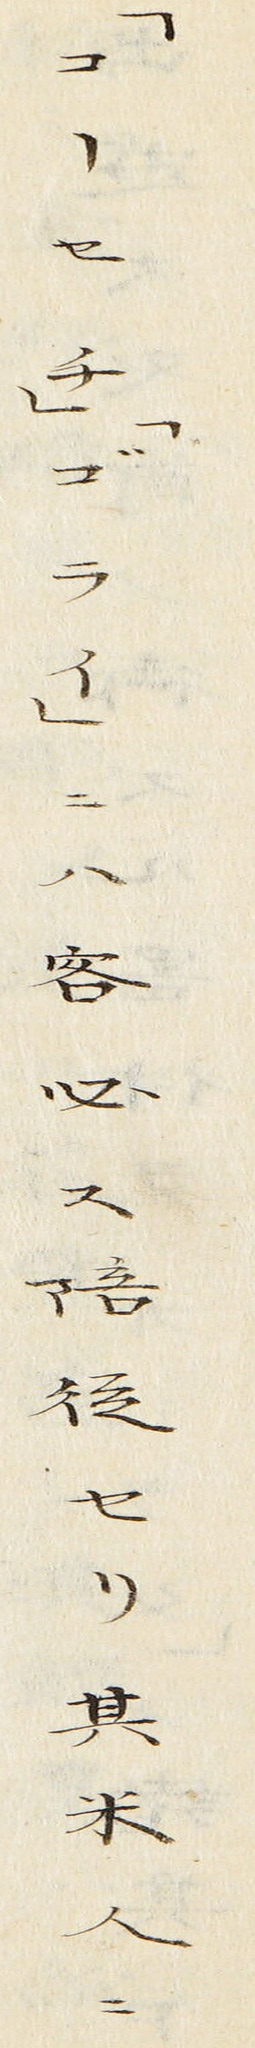「コーセチ」「ゴライ」ニハ客必ずス陪従セリ其米人ニ
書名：蕃談
